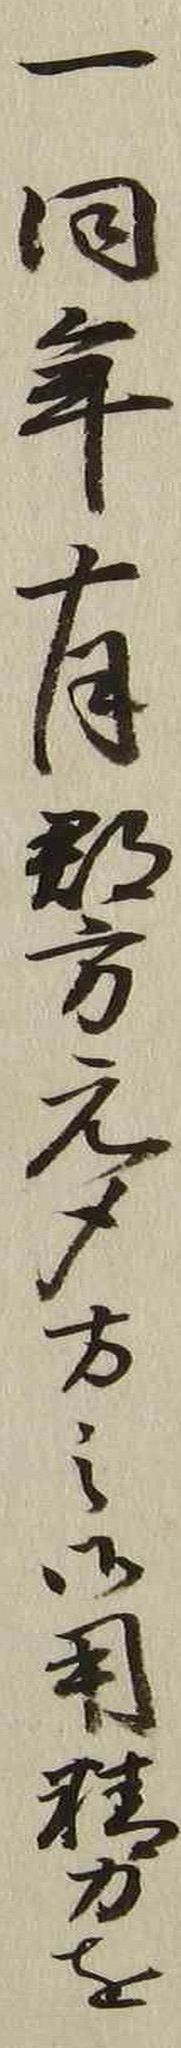一同年十月郡方元〆方之御用精力を
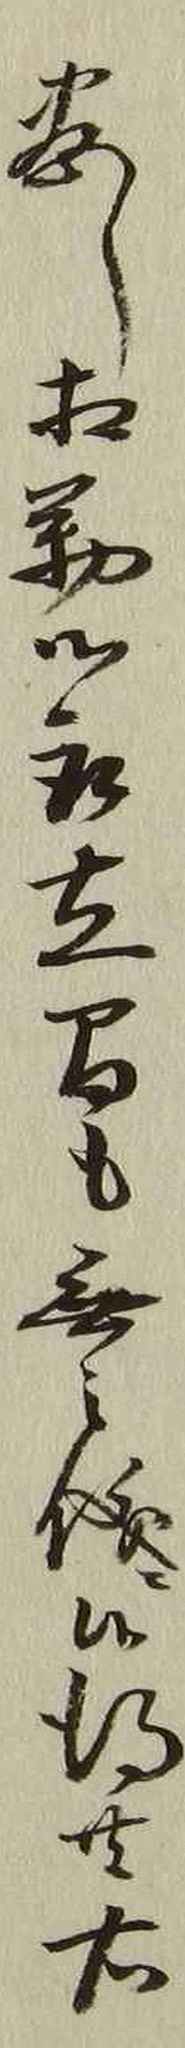尽し相勤候取立間も無之儀ニ候得共右
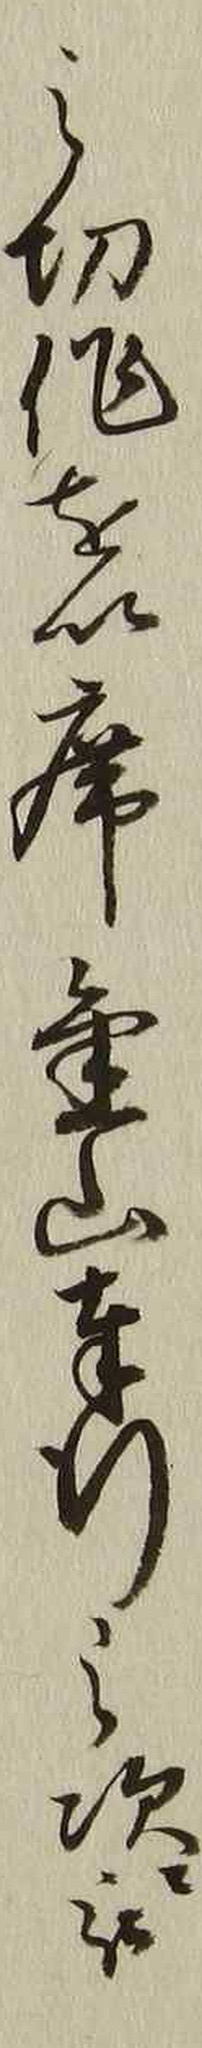之功作を以席金山奉行之次ニ被
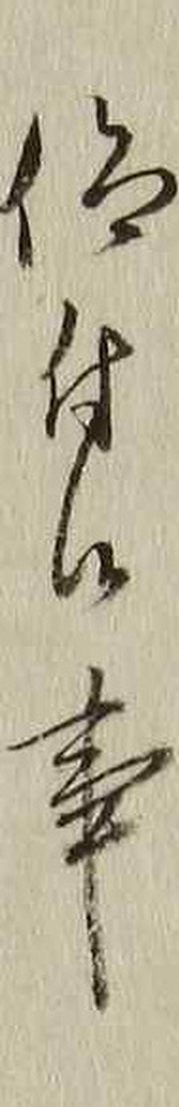仰付候事
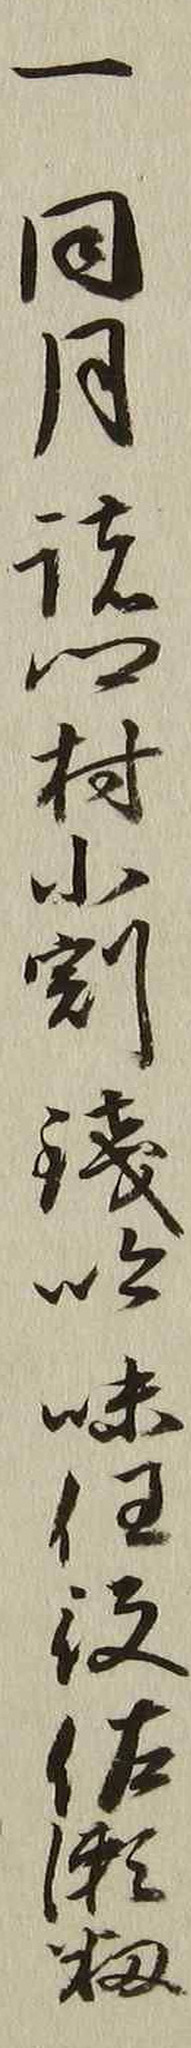一同月諸郷村小割銭吟味任役佐瀬籾
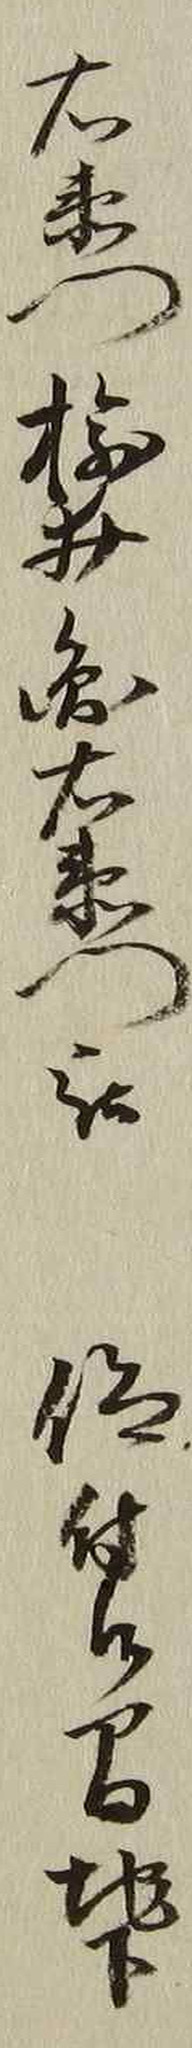右衛門楡井円右衛門被仰付候間地下
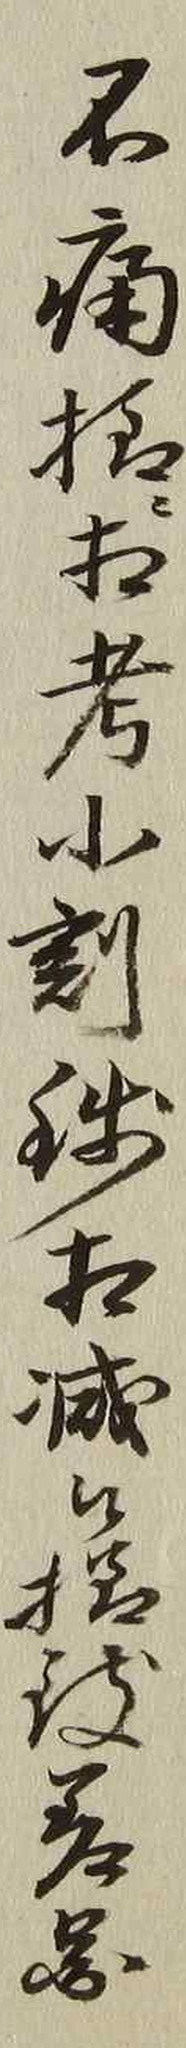不痛様ニ相考小割銭相減候様致差図
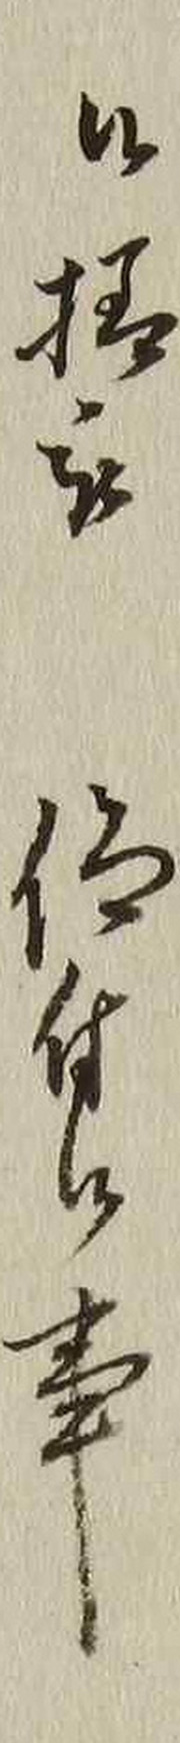候様被仰付候事
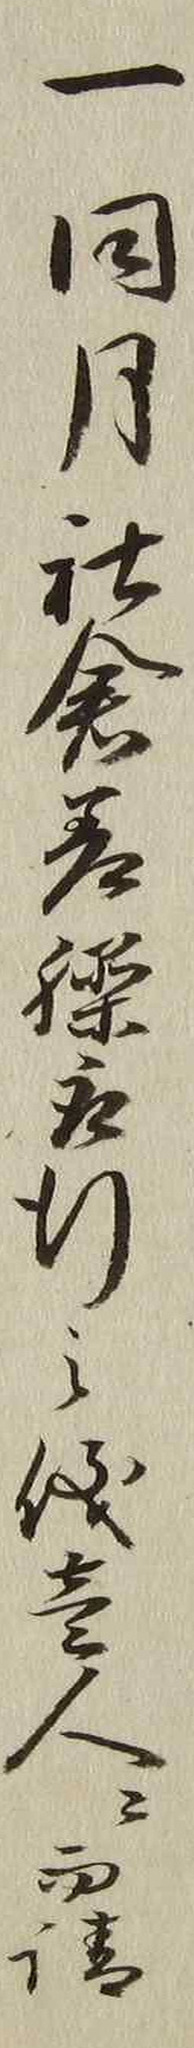一同月社倉差繰取行之儀壱人ニ而請
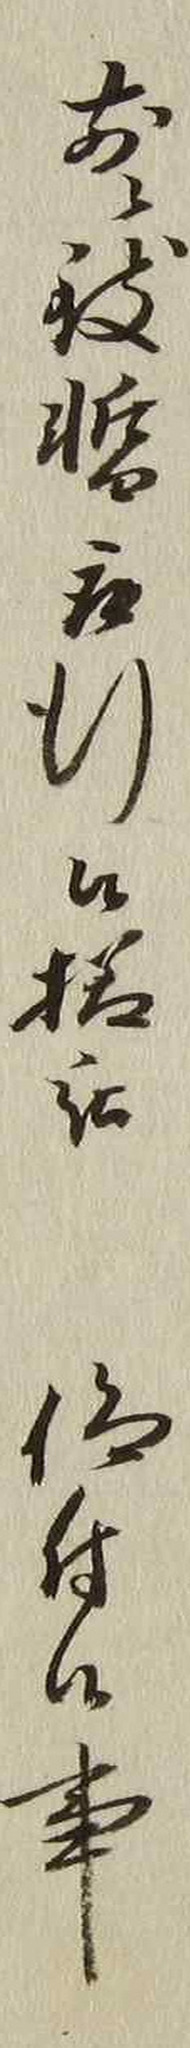前ニ致暫取行候様被仰付候事
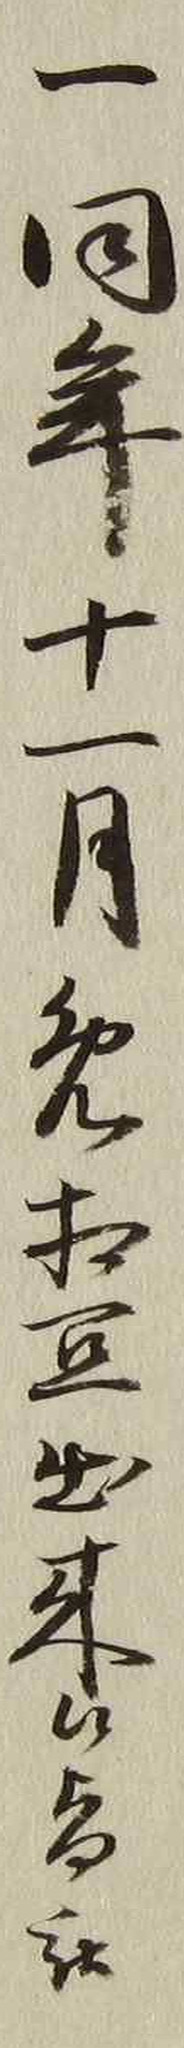一同年十一月免相宜出来候旨被
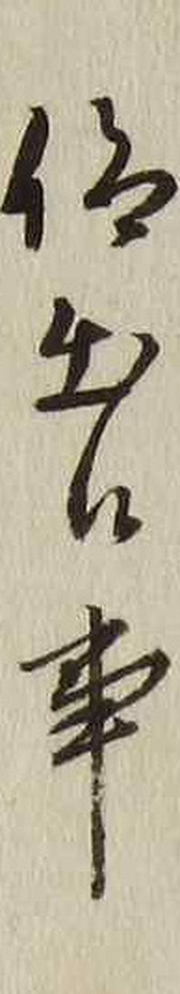仰出候事
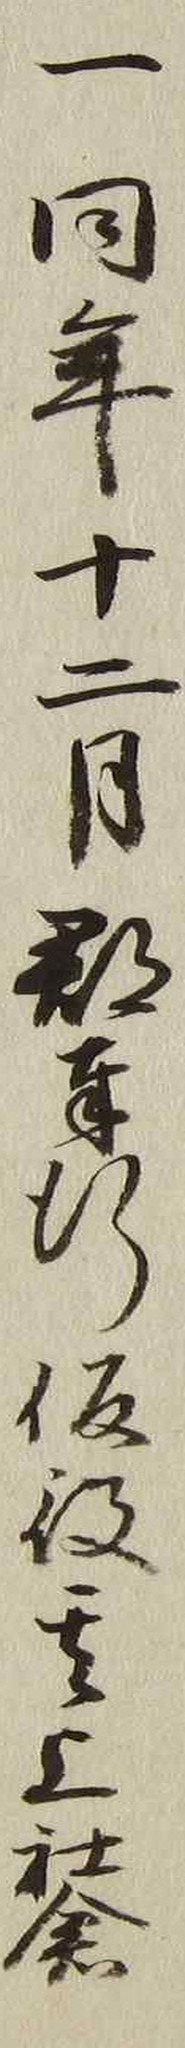一同年十二月郡奉行仮役其上社倉
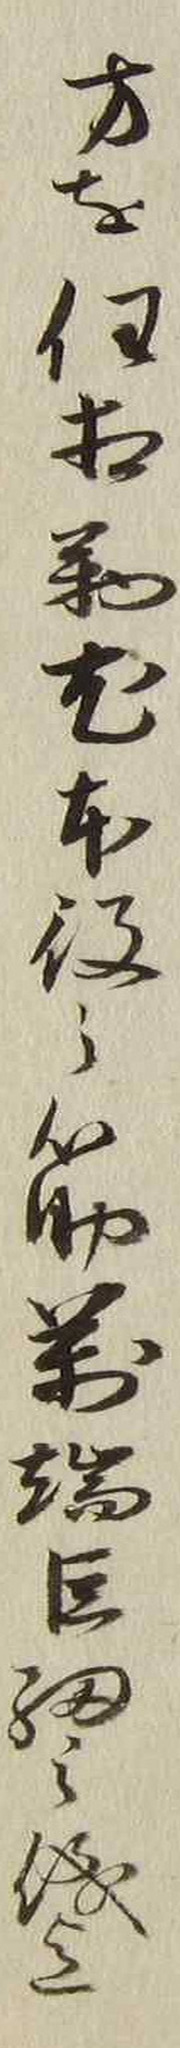方を任相勤尤本役之筋万端巨細之儀迄
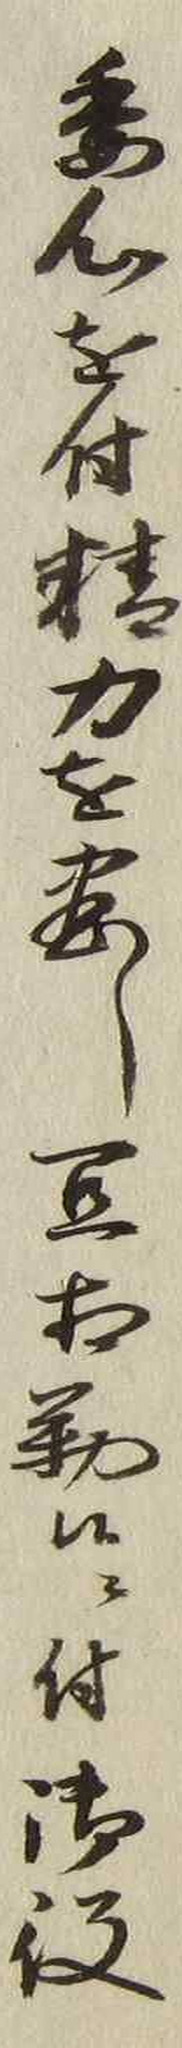委心を付精力を尽し宜相勤候ニ付御役
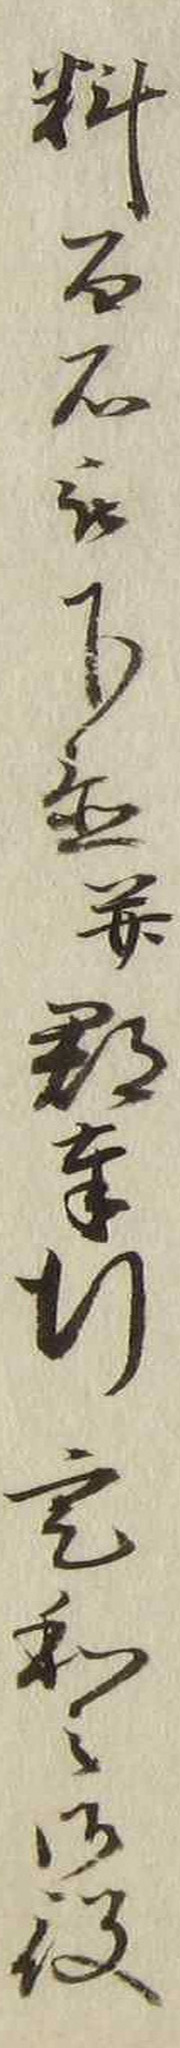料百石被下置幷郡奉行定和之御役
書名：諸士系譜　巻之61　と之部4
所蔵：会津若松市立会津図書館
